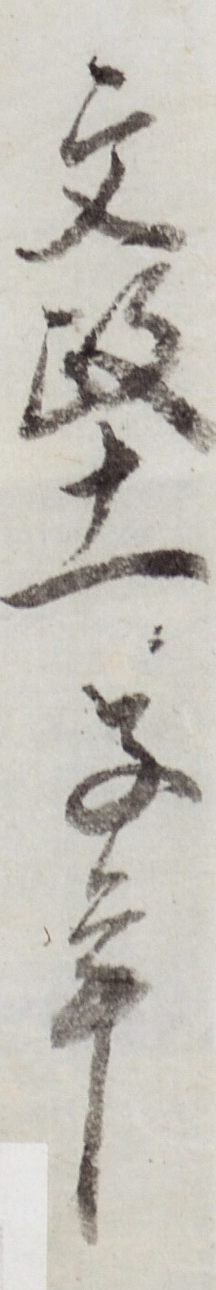文政十一子年
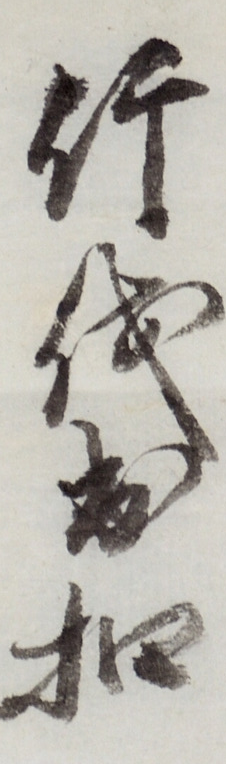竹伐出扣
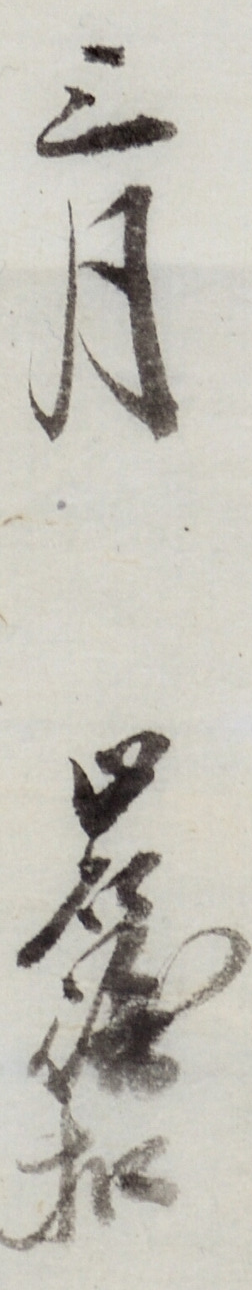三月岩崎扣
